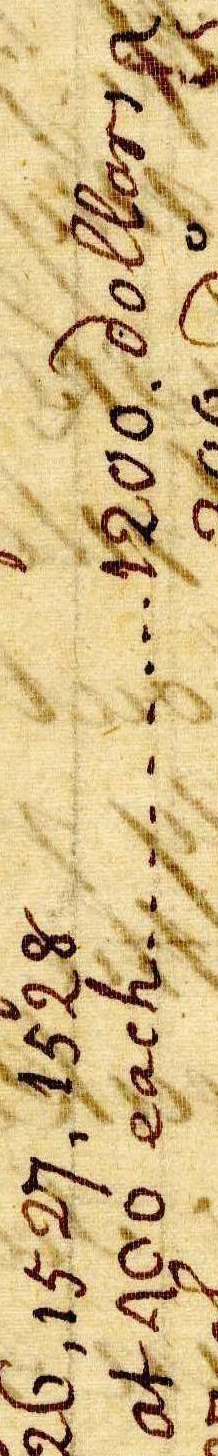at 400 each---------1200 dollars
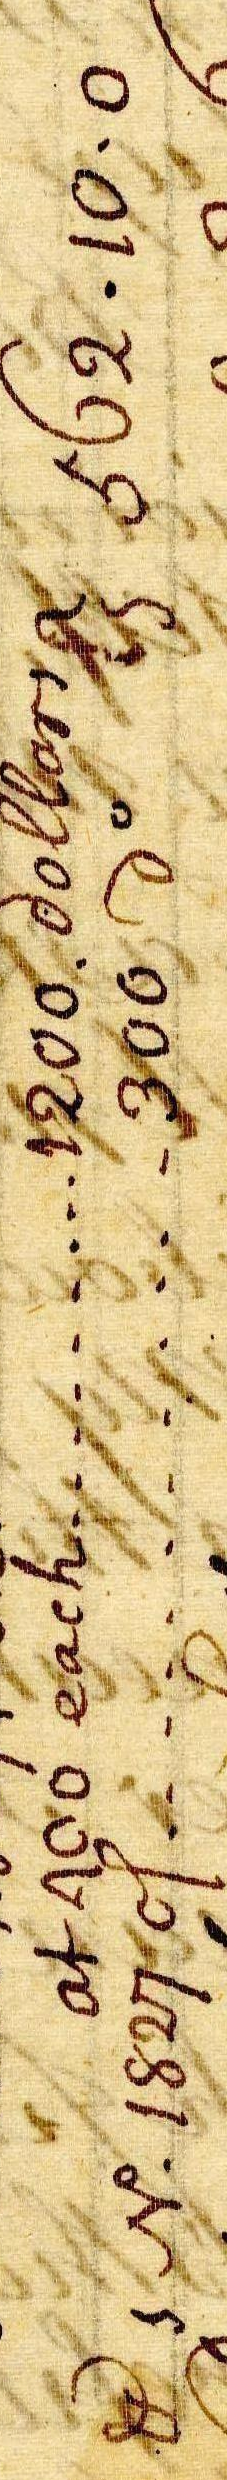& s N^o. 1827 of------------300 d^o 562.10.0
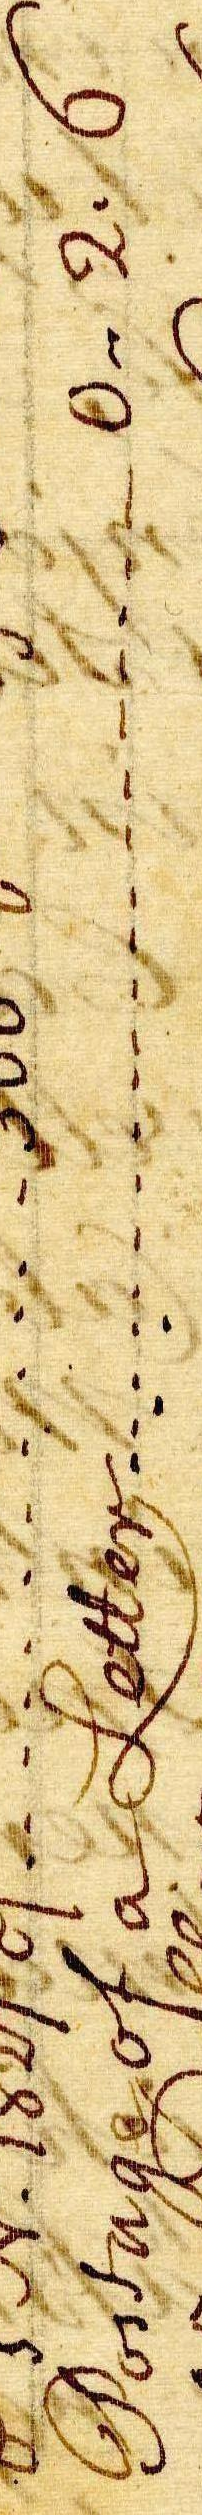Postage of a Letter--------------------0..2.6
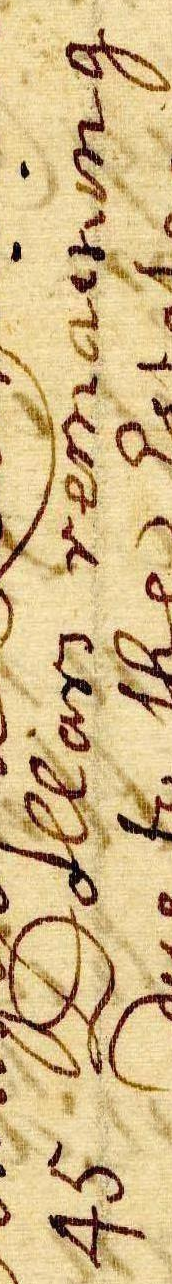45 Dollars remaining
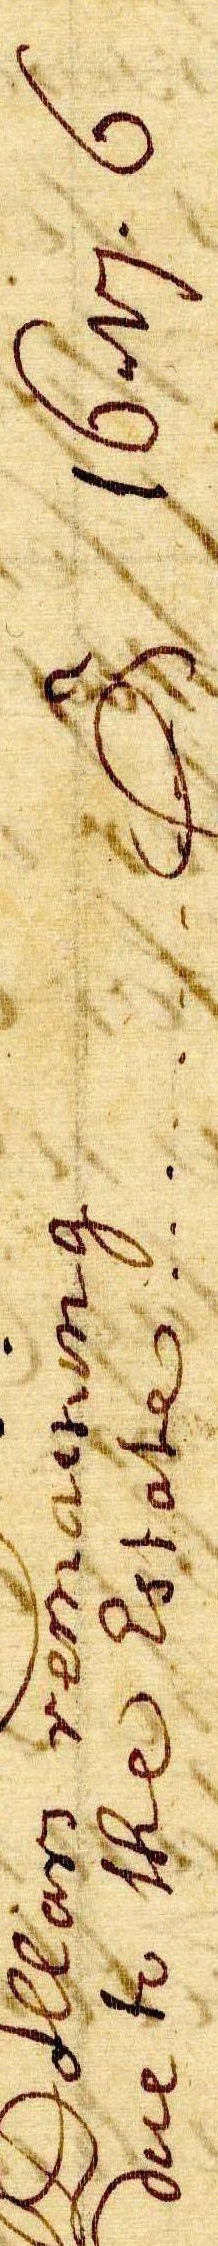due to the Estate--------16..17.6
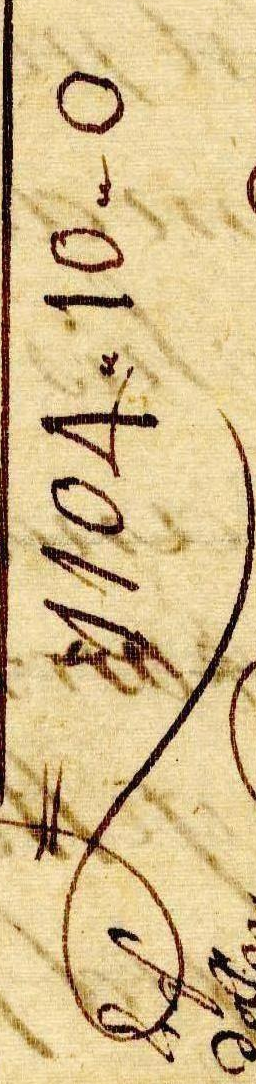£ 1104..10..0
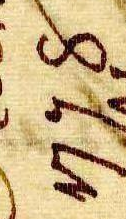1778
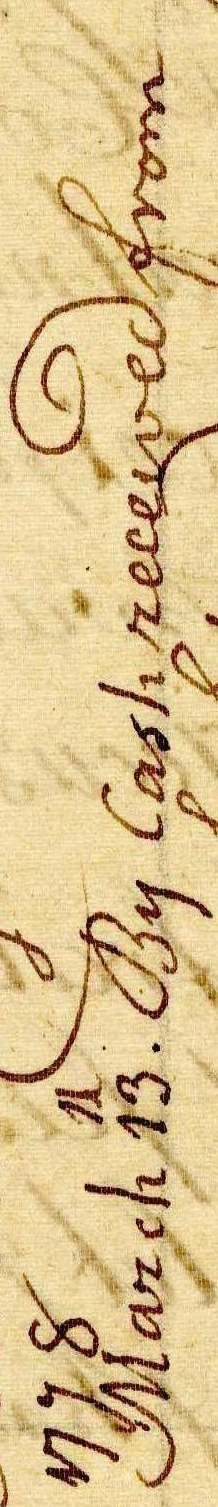March 13^th By Cash received from
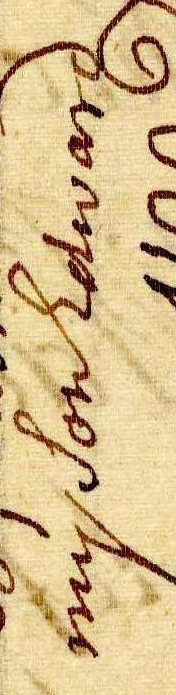my Son Edward
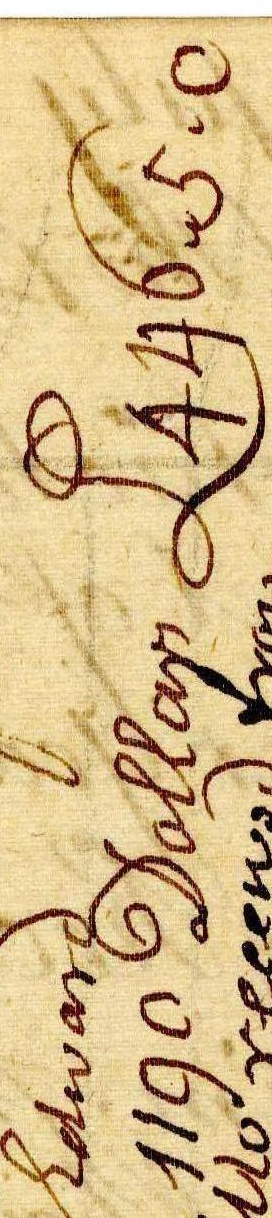1190 Dollars £446..5.0
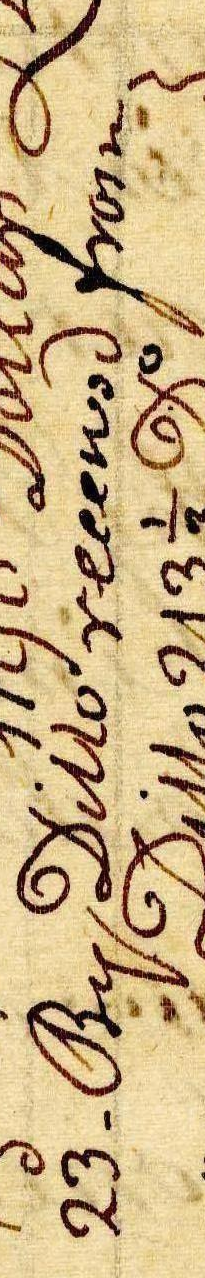23^d- By Ditto received from
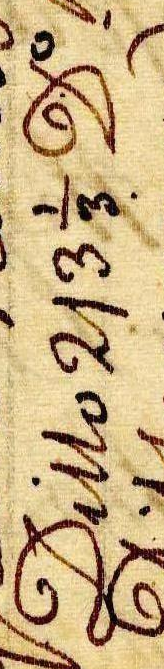Dille 213 1/3 D^o
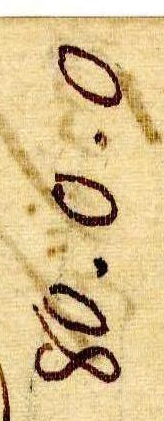80.0.0
